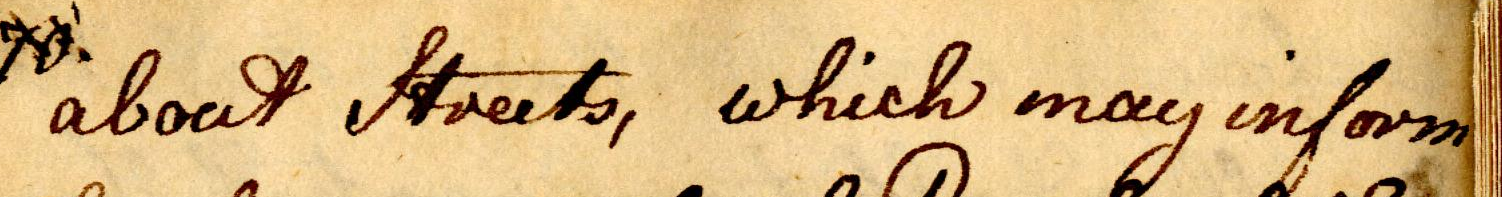about Streets, which may inform
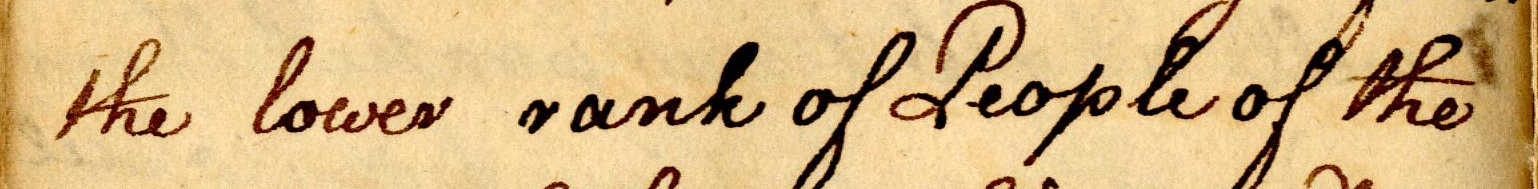the lower rank of People of the
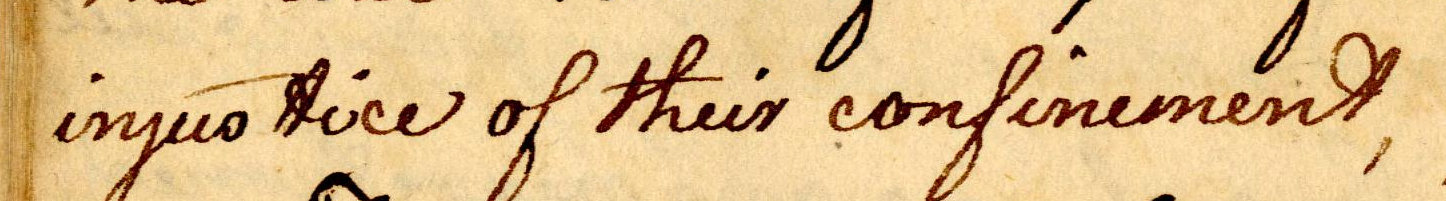injustice of their confinement,
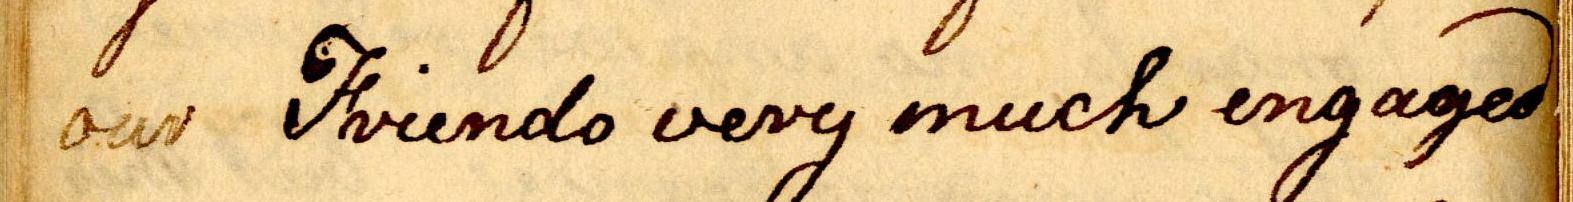our Friends very much engaged
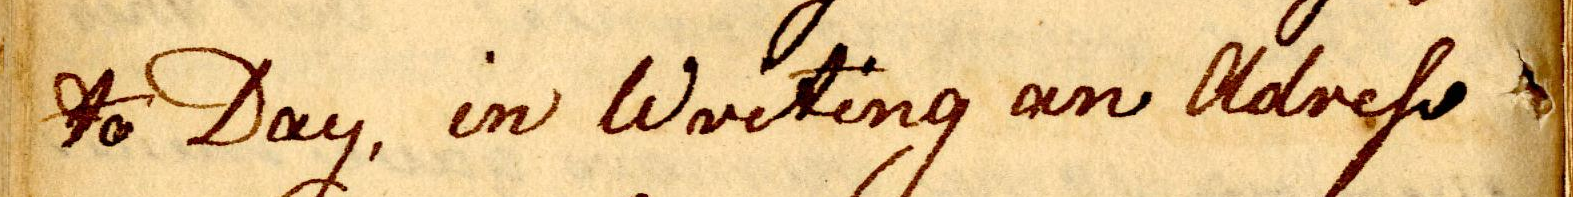to Day, in Writing an Adress
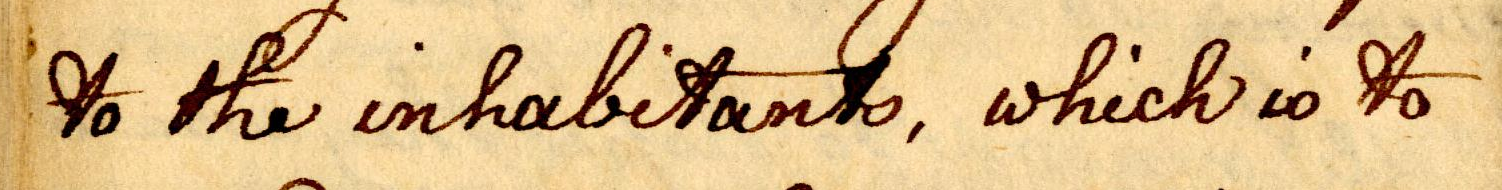to the inhabitants, which is to
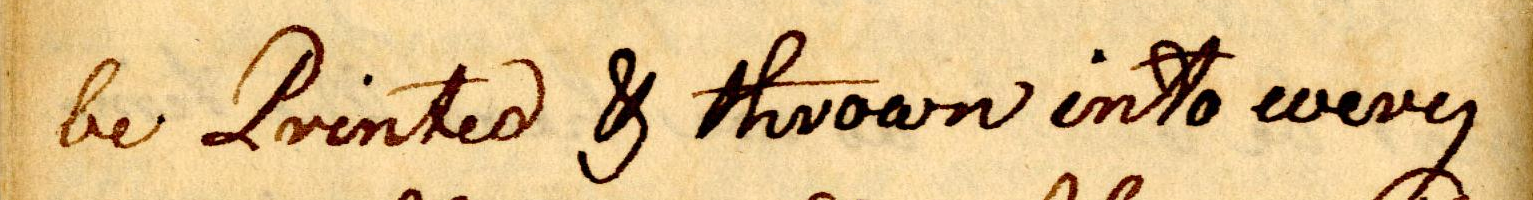be Printed & thrown into every
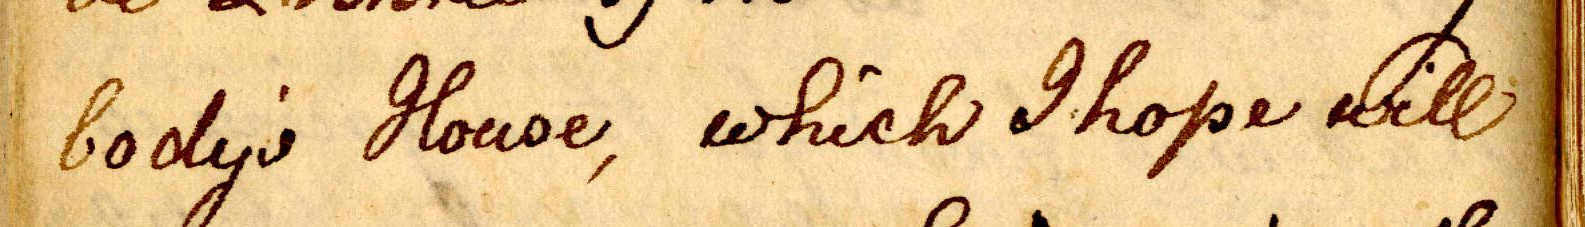body's House, which I hope will
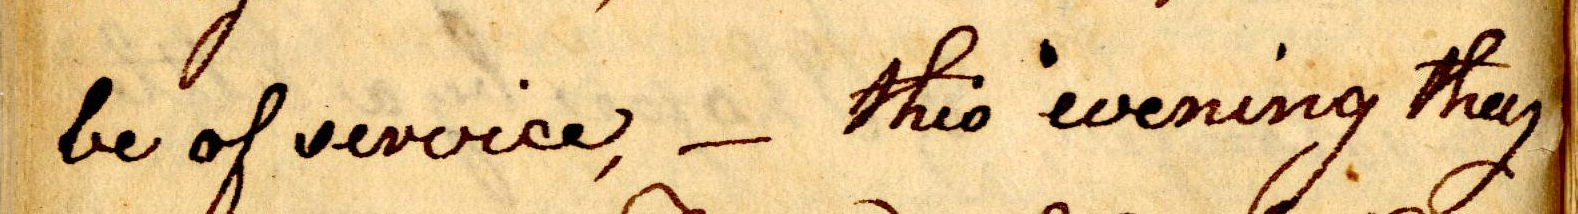be of service,- this evening they
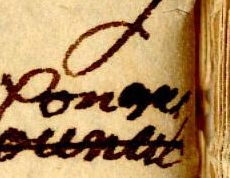ongress
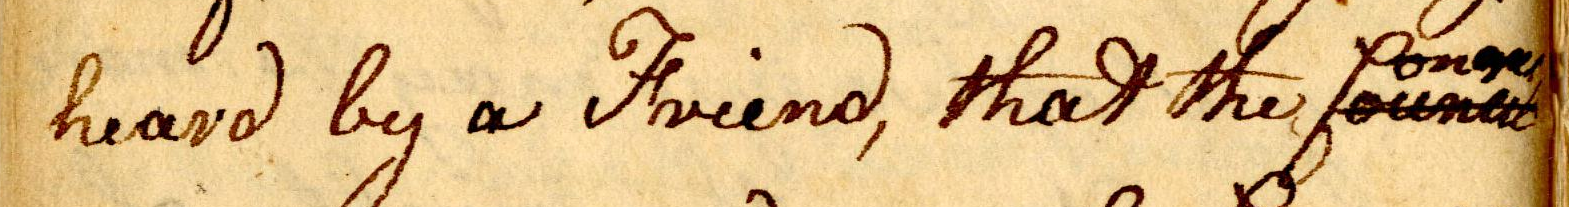heard by a Friend, that the C[ouncil]
